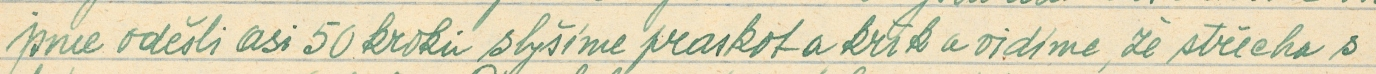jsme odešli asi 50 kroků slyšíme praskot a křik a vidíme, že střecha s
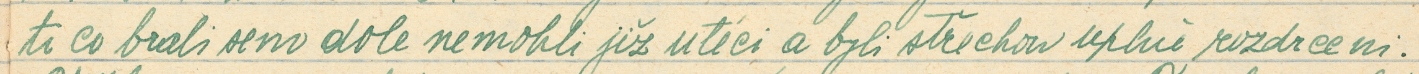ti co brali seno dole nemohli již utéci a byli střechou uplně rozdrceni.
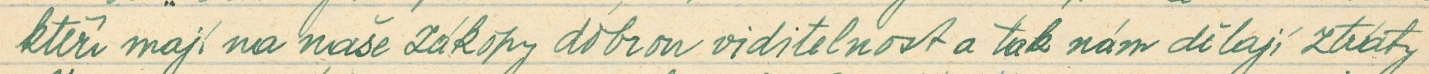kteří mají na naše zákopy dobrou viditelnost a tak nám dělají ztráty.
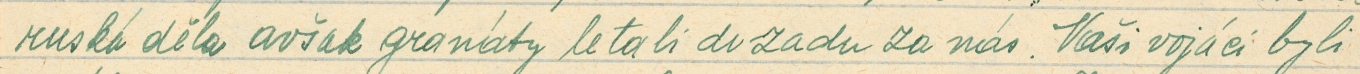ruská děla avšak granáty letali do zadu za nás. Naši vojáci byli
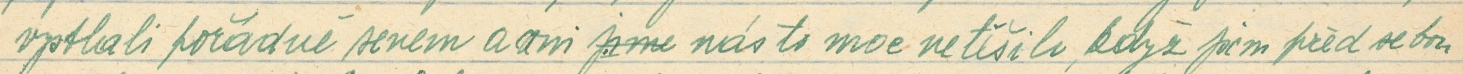vystlali pořádně senem a ani jsme nás to moc netěšilo, když jsem před sebou
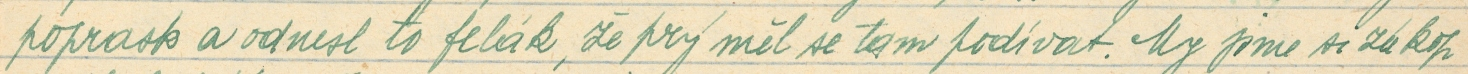poprask a odnesl to felák, že prý měl se tam podívat. My jsme si zákop
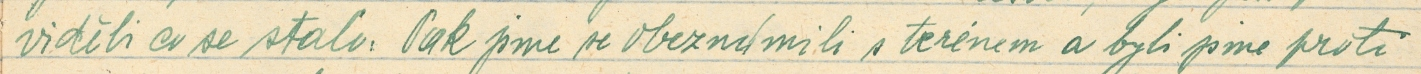viděli co se stalo: Pak jsme se obeznámili s terénem a byli jsme proti
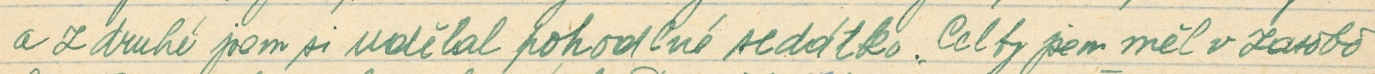a z druhé jsem si udělal pohodlné sedátko. Celty jsem měl v zasobě
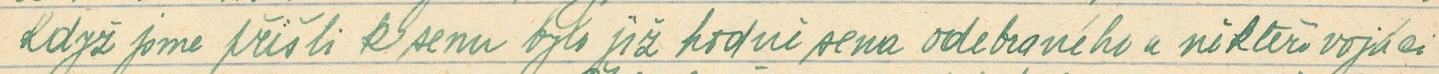Když jsme přišli k senu bylo již hodně sena odebraného a někteři vojáci
